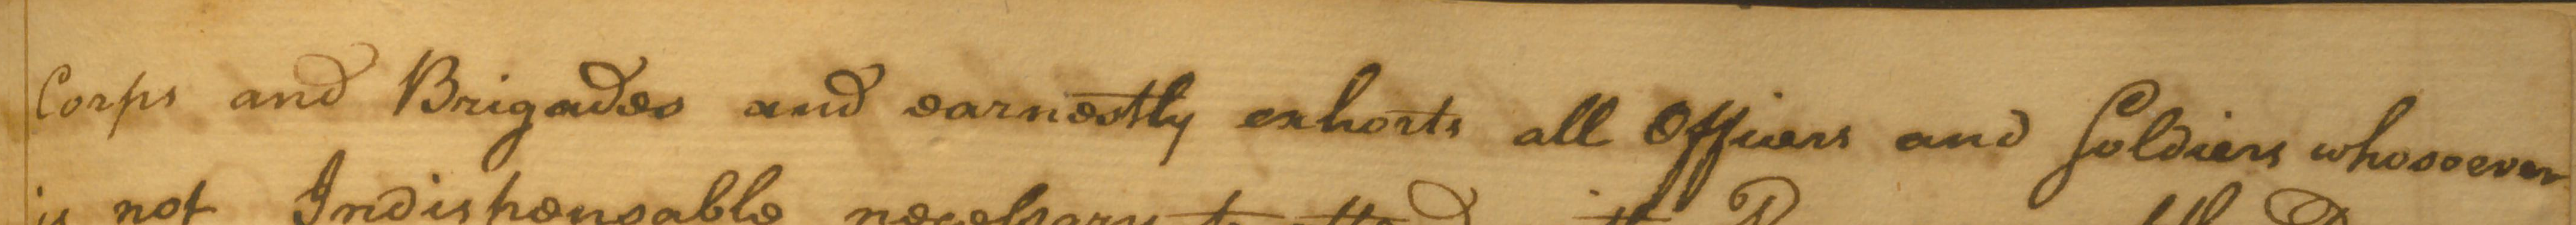Corps and Brigades and earnestly exhorts all Officers and Soldiers whosoever
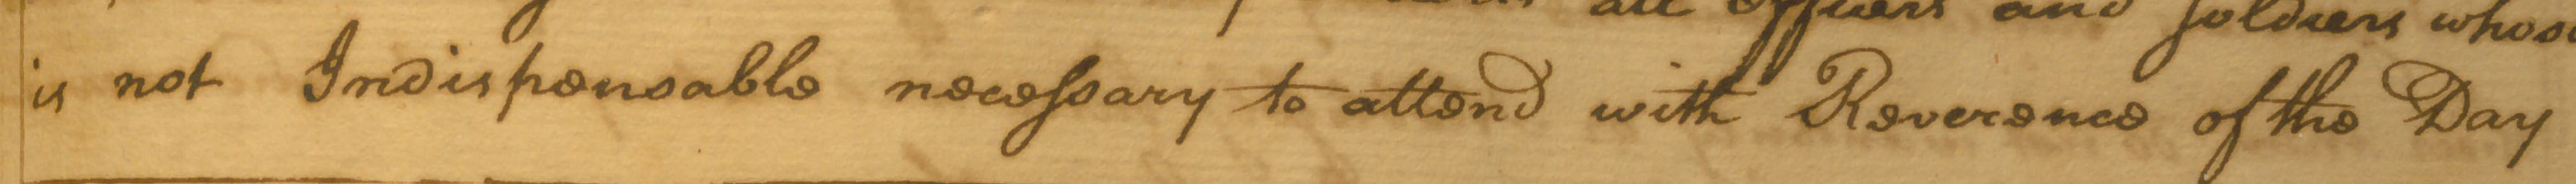is not Indispensable necessary to attend with Reverence of the Day
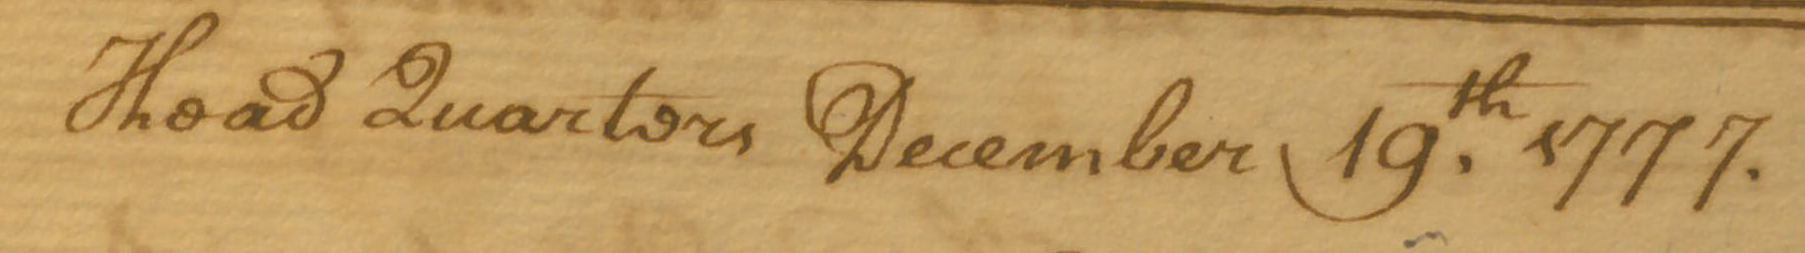Head Quarters December 19^th. 1777.
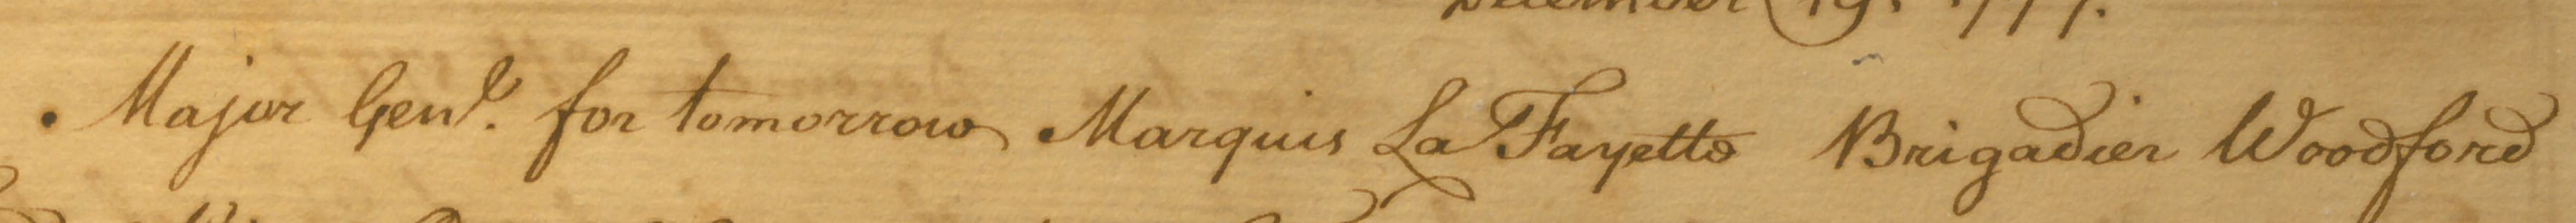Major Gen^l. for tomorrow Marquis La Fayette Brigadier Woodford
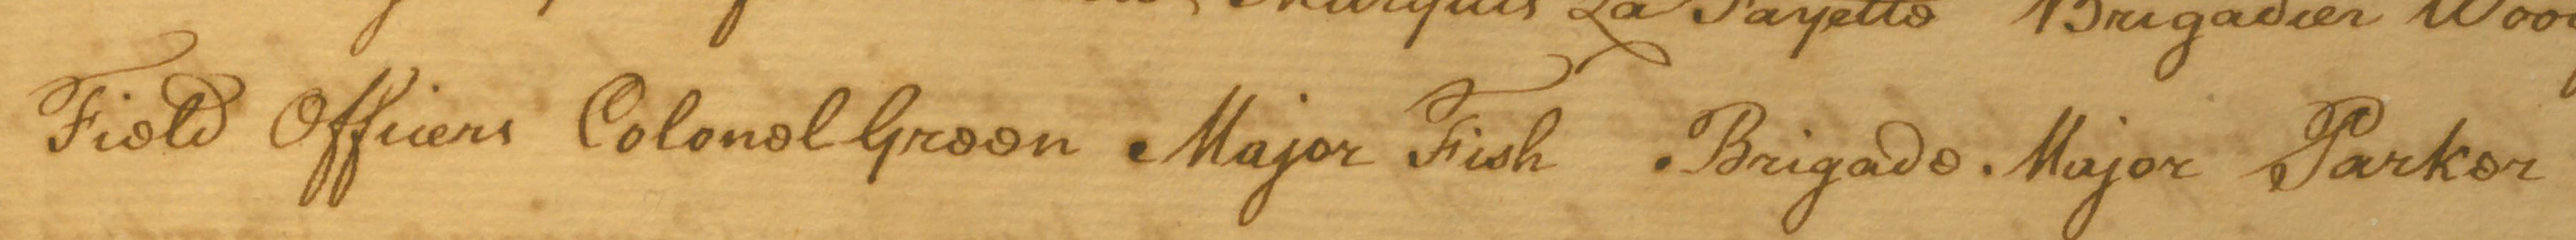Field Officers Colonel Green Major Fish Brigade Major Parker
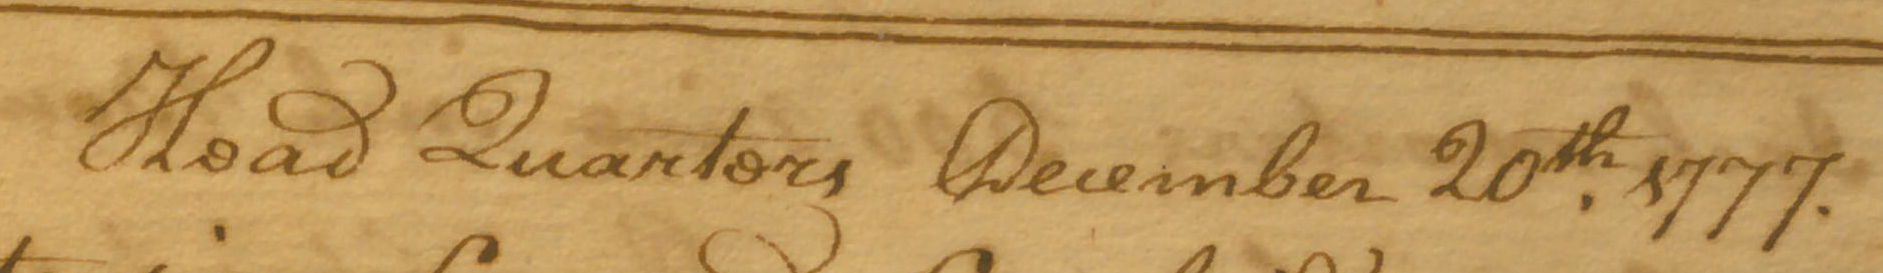Head Quarters December 20^th. 1777.
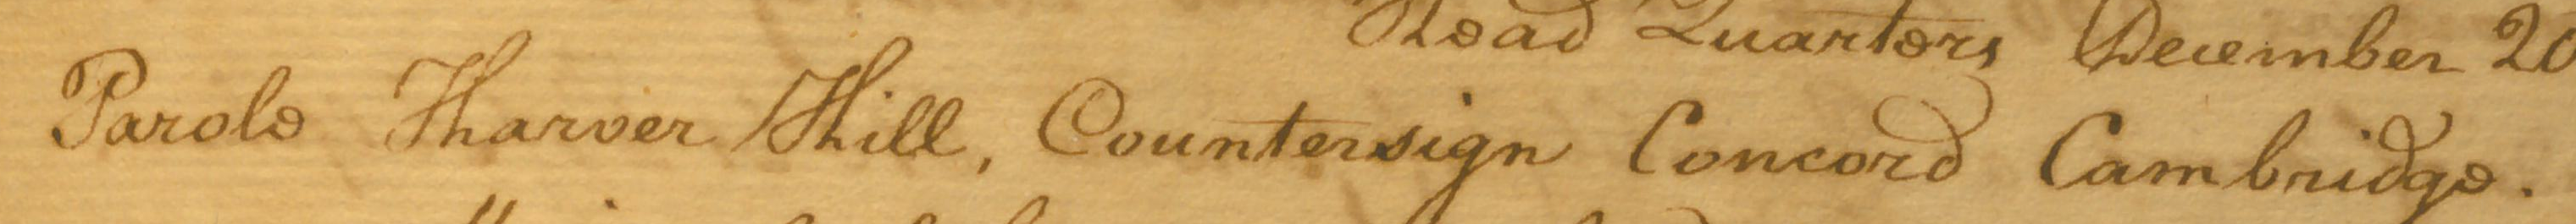Parole Harver Hill, Countersign Concord Cambridge.
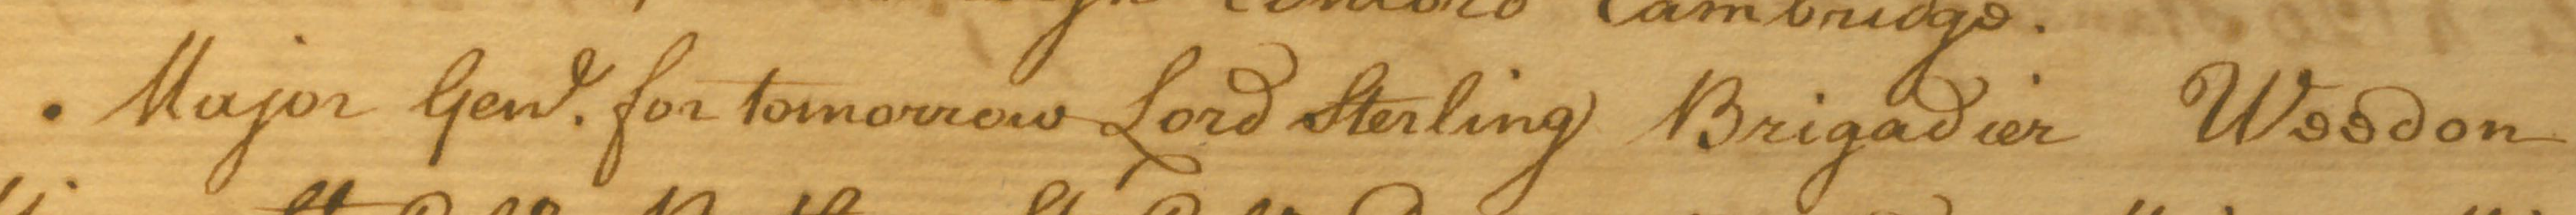Major Gen^l. for tomorrow Lord Sterling Brigadier Weedon
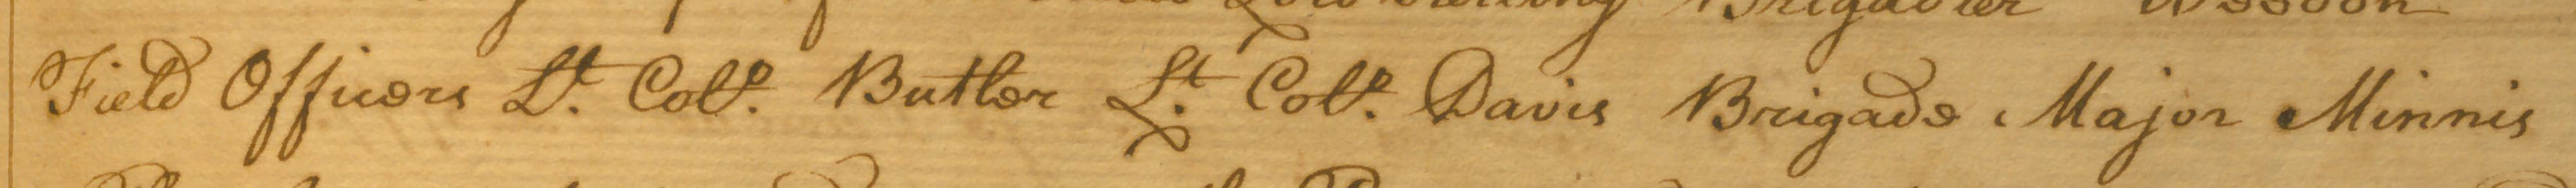Field Officers L^t. Col^o. Butler L^t. Col^o. Davis Brigade Major Minnis
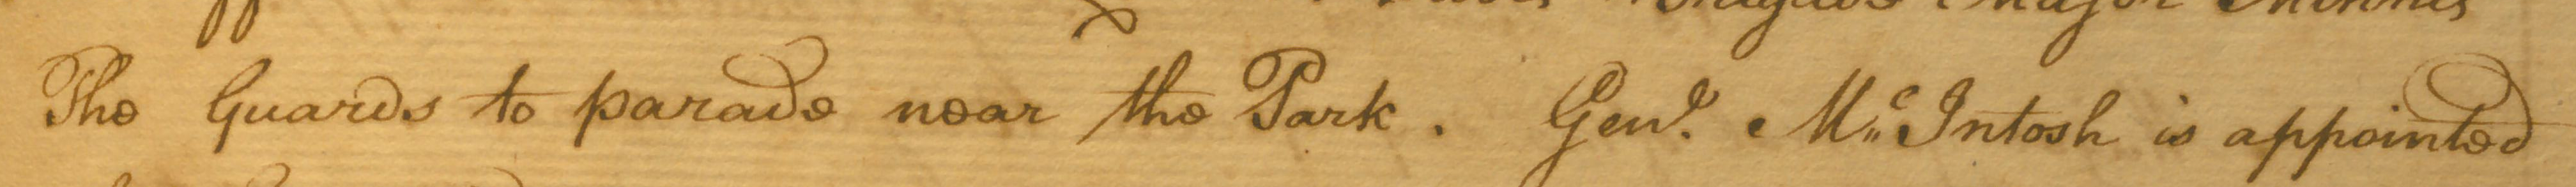The Guards to parade near the Park. Gen^l. M^c.Intosh is appointed
